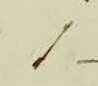1
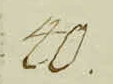40
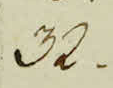32
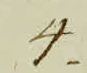4
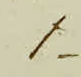1
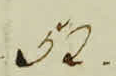52
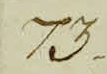73
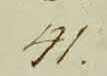41
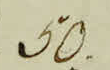50
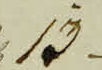13
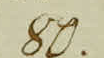80
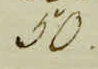50
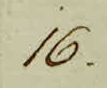16
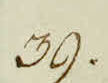39
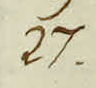27
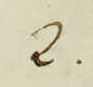2
